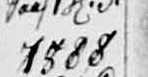7588
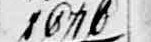1676
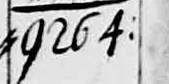9264
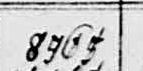8364
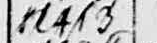12413
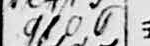9106
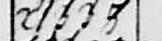21335
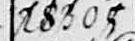28305
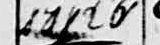13126
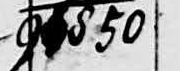91850
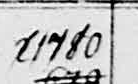21780
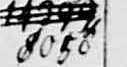8050
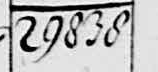29838
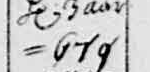=679
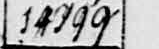14399
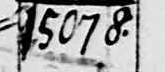15078
